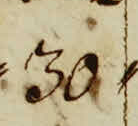30
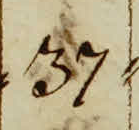37
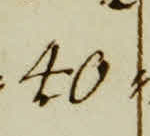40
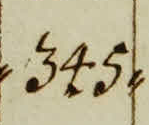345
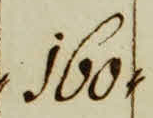160
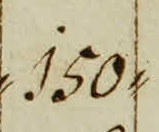150
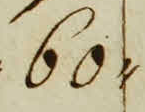60
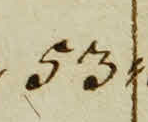53
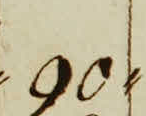90
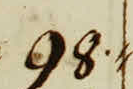98
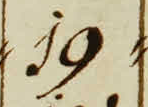19
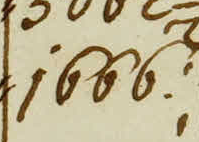1666
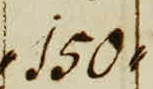150
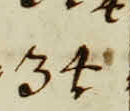34
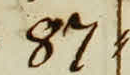87
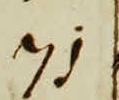71
